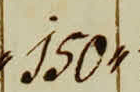150
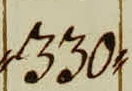330
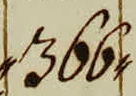366
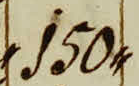150
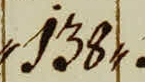138
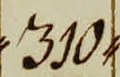310
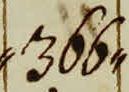366
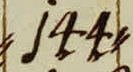144
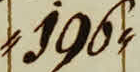196
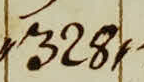328
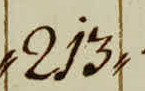213
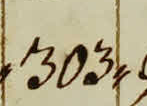303
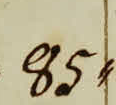85
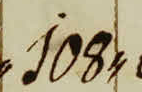108
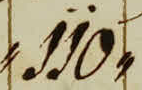110
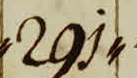291
